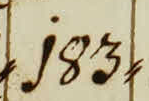183
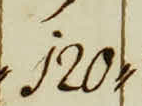120
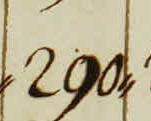290
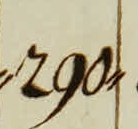290
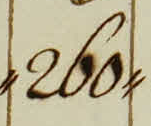260
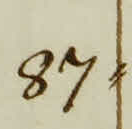87
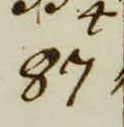87
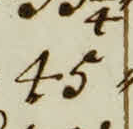45
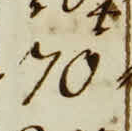70
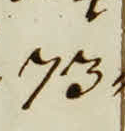73
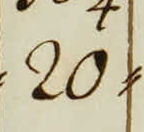20
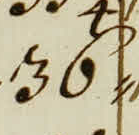36
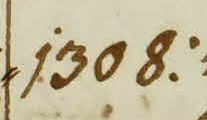1308.
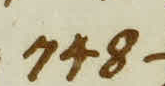748
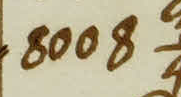8008
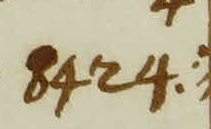8424.
